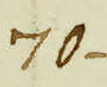70
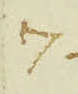7
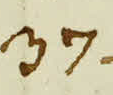37
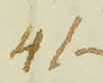41
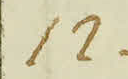12
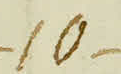10
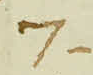7
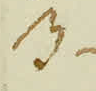3
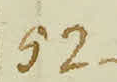52
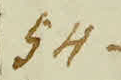54
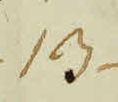13
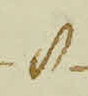8
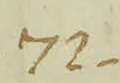72
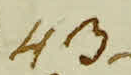43
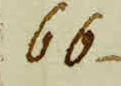66
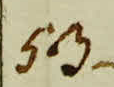53
